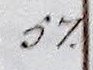57.
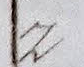2
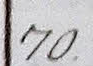70
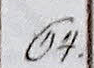64
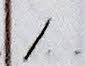1.
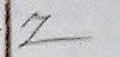7
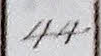44
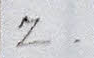2
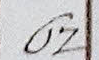67
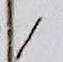1
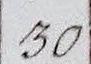30
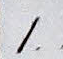1
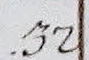37
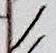1
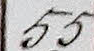53
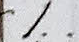1.
